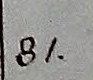81.
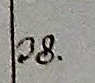38.
